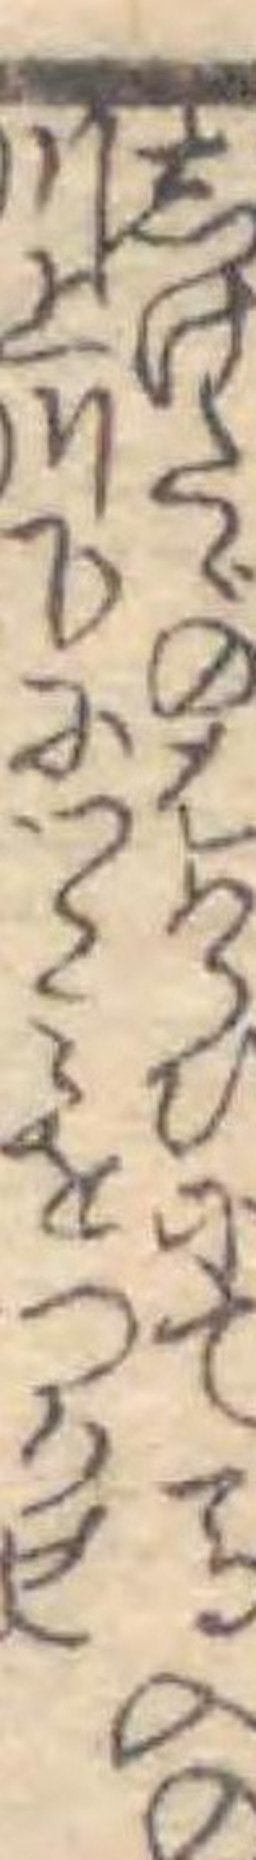川上川下につゝみをつかせ
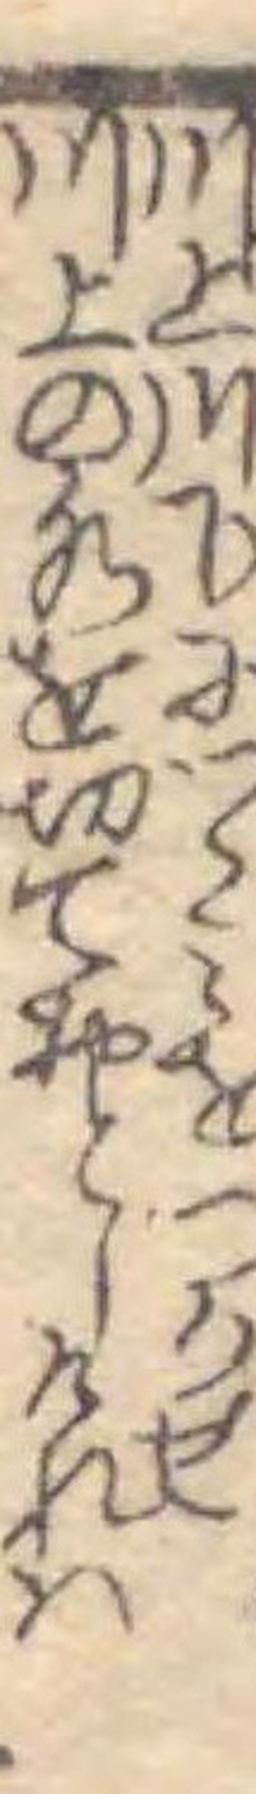川上の水を切ておとしけれは
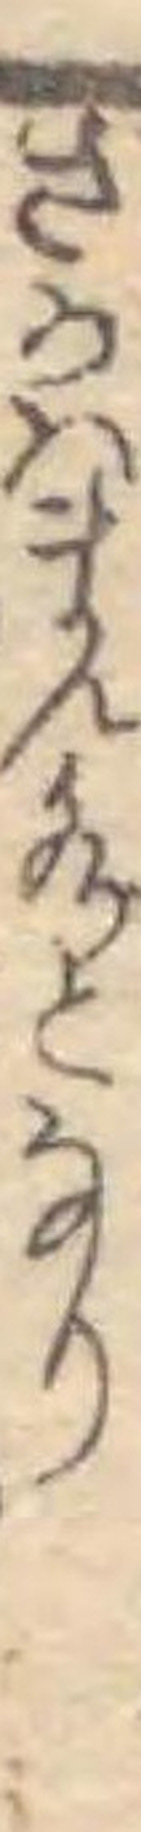さかはまん水となり
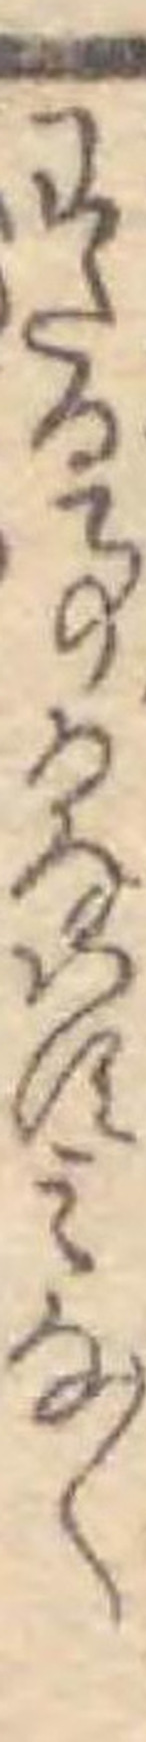わたる事かなはすみな〳〵
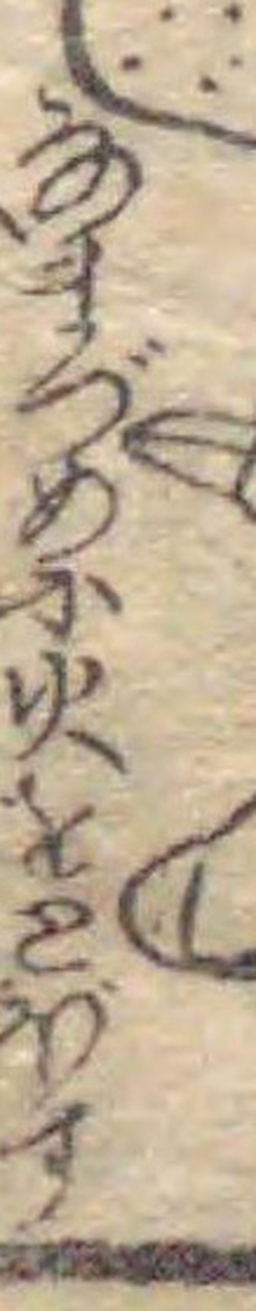あまづめに火をとぼす
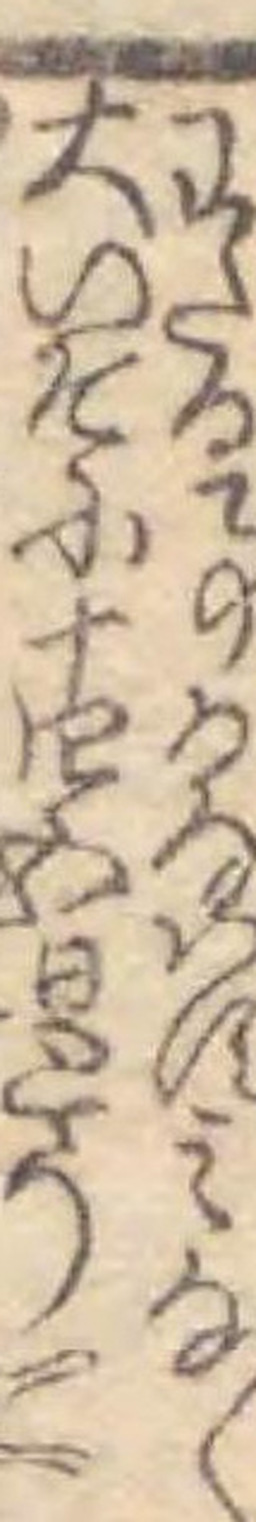大いそに十四五日とう
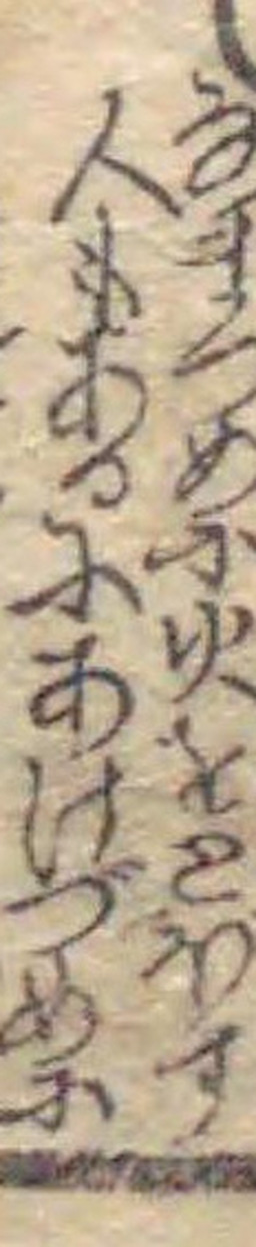人もあるにあけづめに
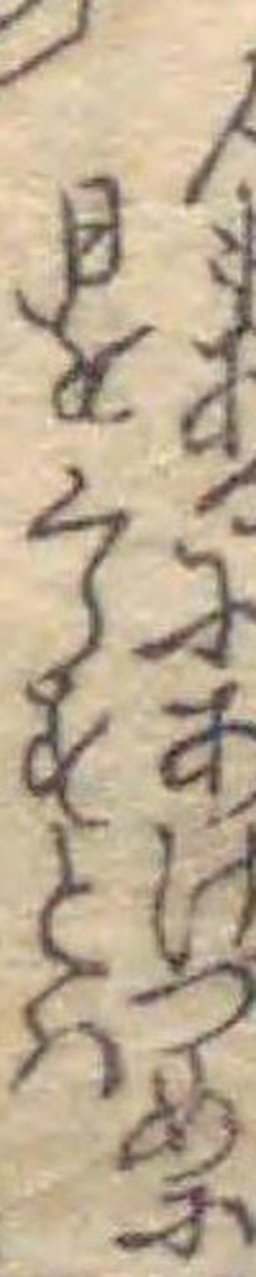日をくらすとは
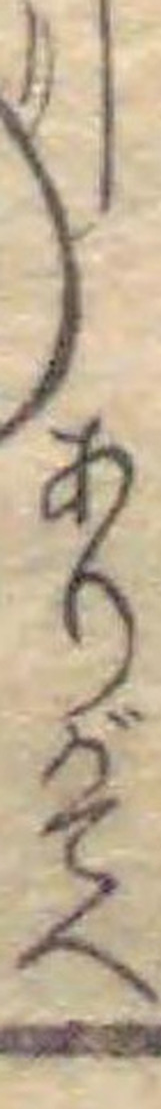ありがてへ
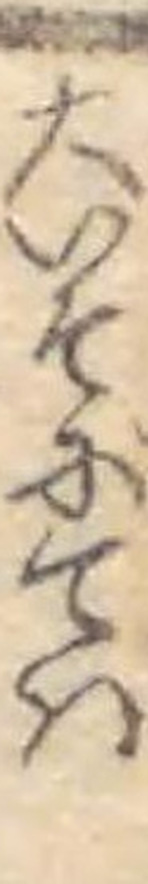大いそにては
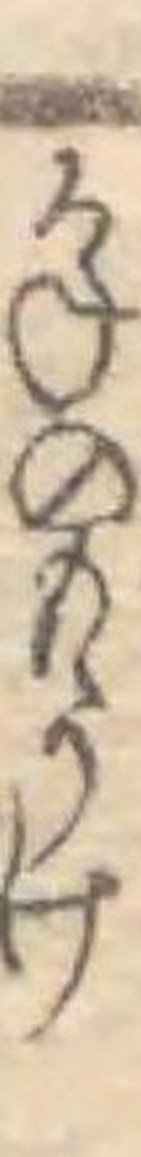かねのもうけ
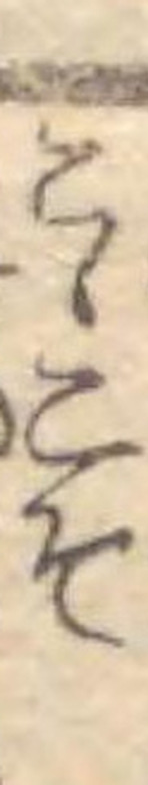こゝこそ
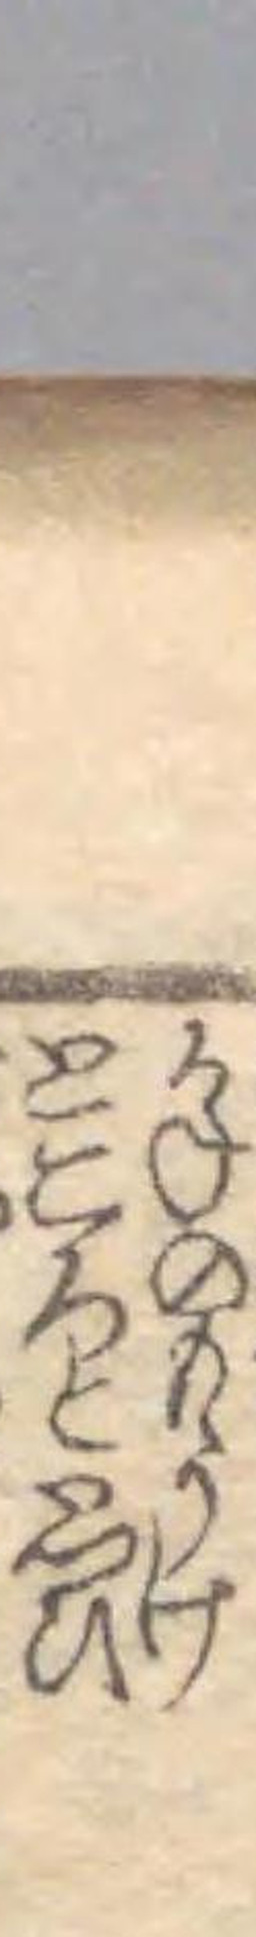ところと思ひ
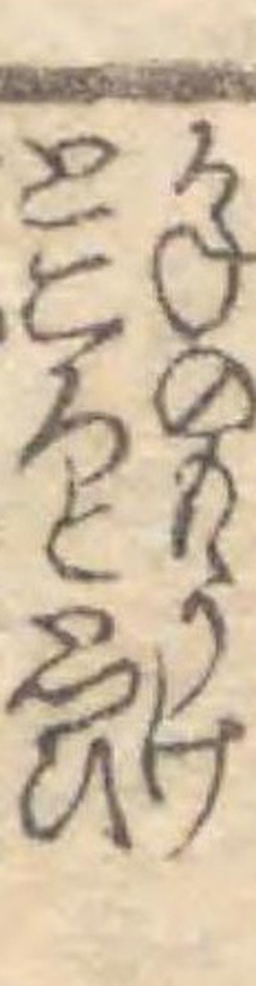ところと思ひ
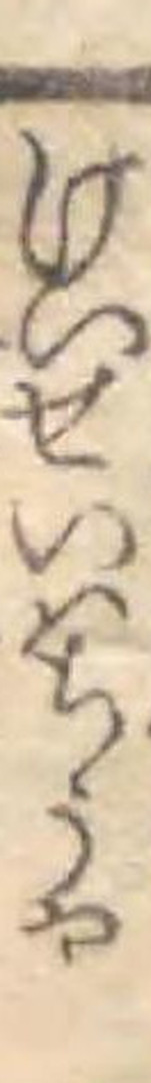けいせいはちうや
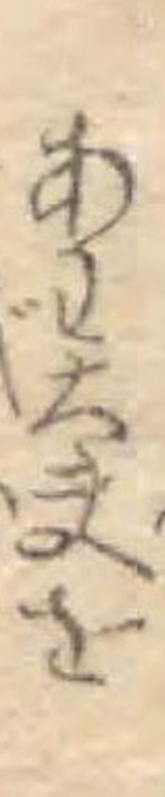あわ大夫を
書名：文武二道万石通 : 3巻
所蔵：国立国会図書館 National Diet Library, JAPAN
